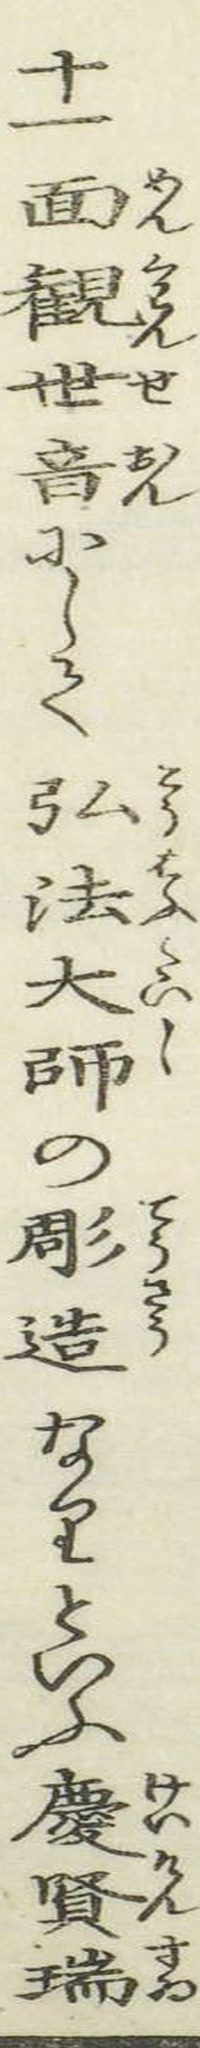十一面観世音にして弘法大師の彫造なりといふ慶賢瑞
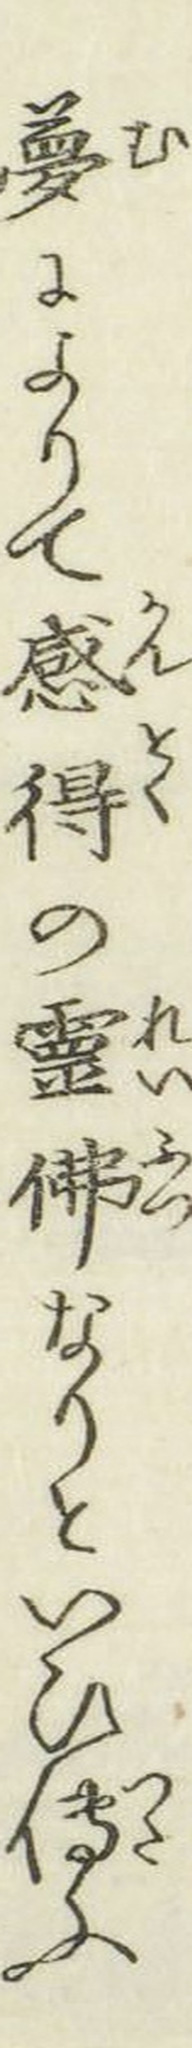夢によりて感得の霊佛なりといひ傳ふ
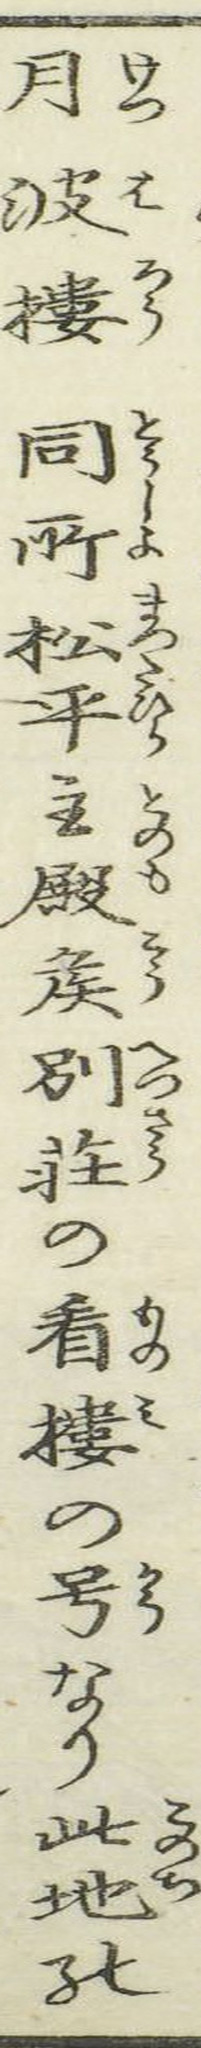月波楼同所松平主殿侯別荘の看楼の号なり此地の
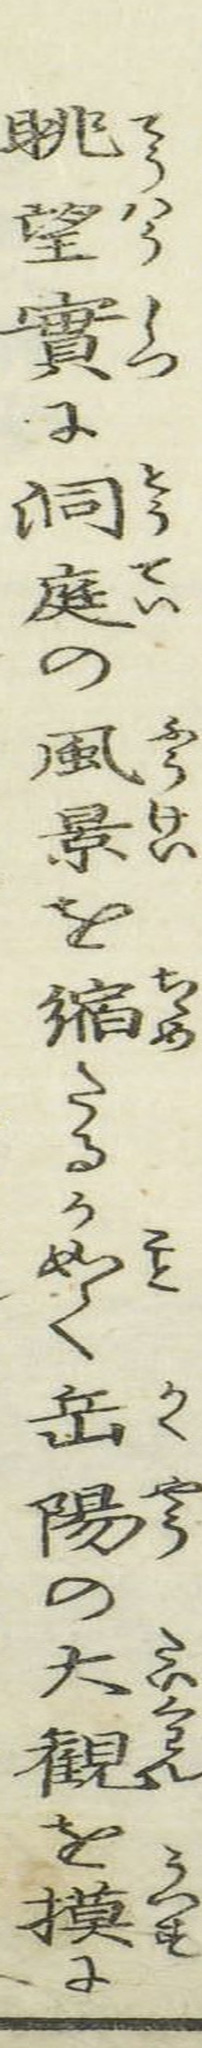眺望實に洞庭の風景を縮たるか如く岳陽の大観を摸に
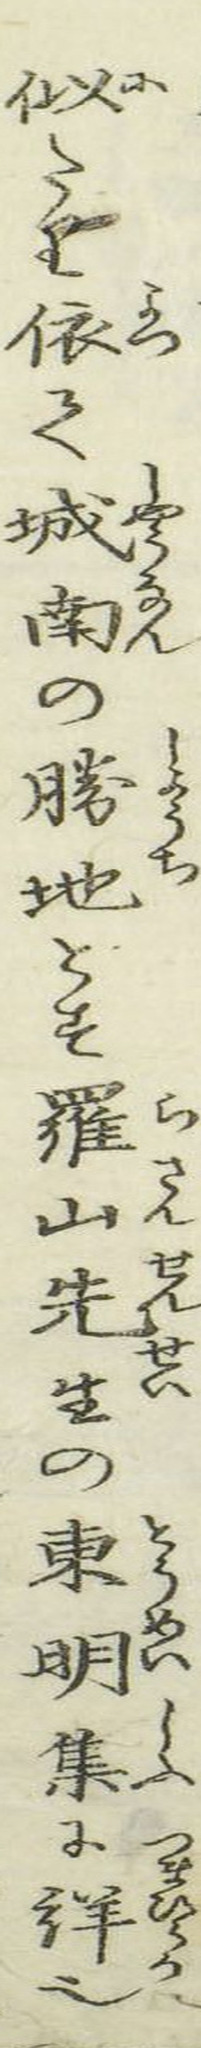似たり依て城南の勝地とす羅山先生の東明集に詳也
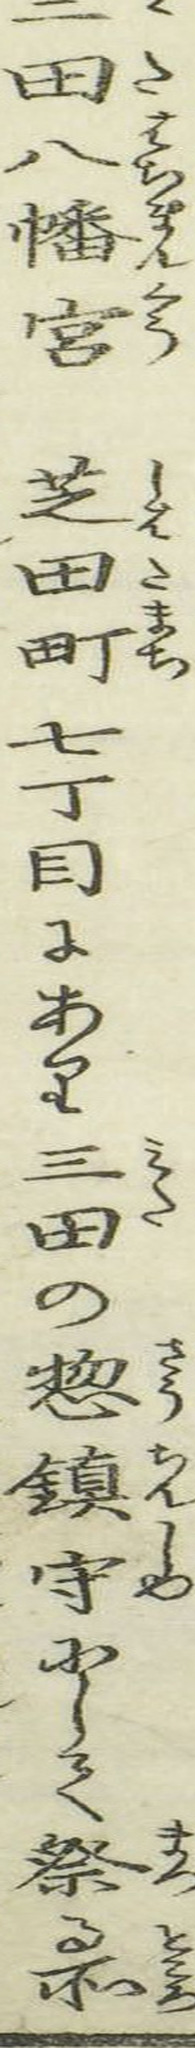三田八幡宮芝田町七丁目にあり三田の惣鎮守にして祭る所
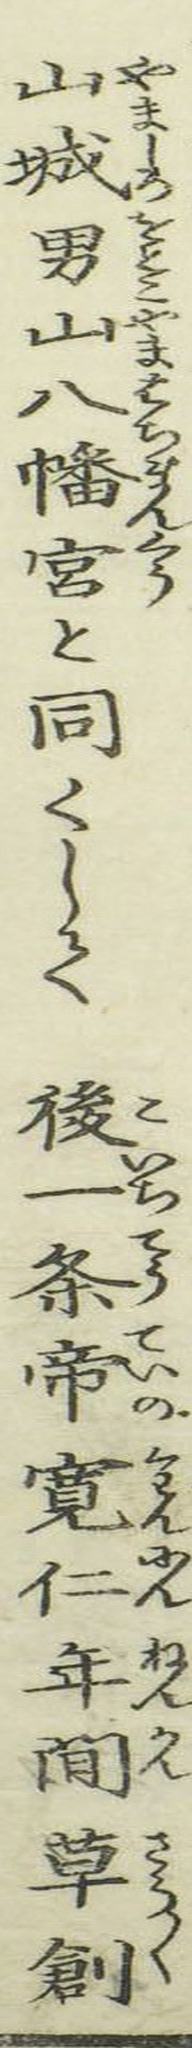山城男山八幡宮と同くして後一条帝寛仁年間草創

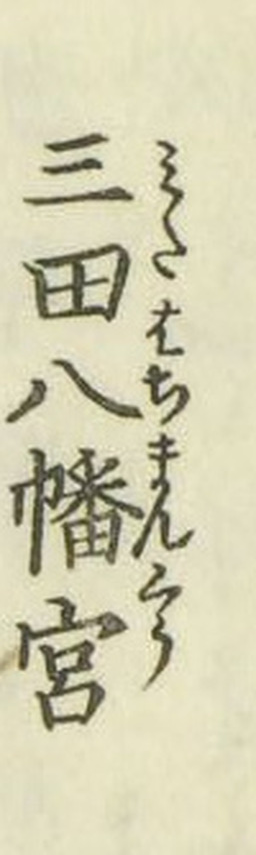三田八幡宮

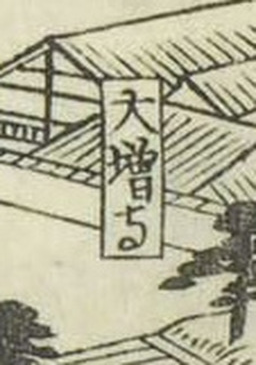大増寺
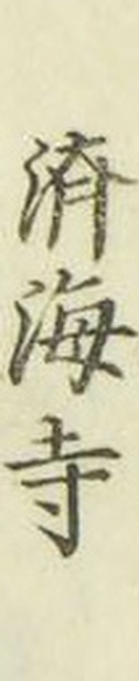済海寺
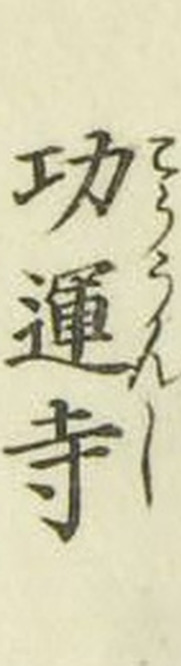功運寺

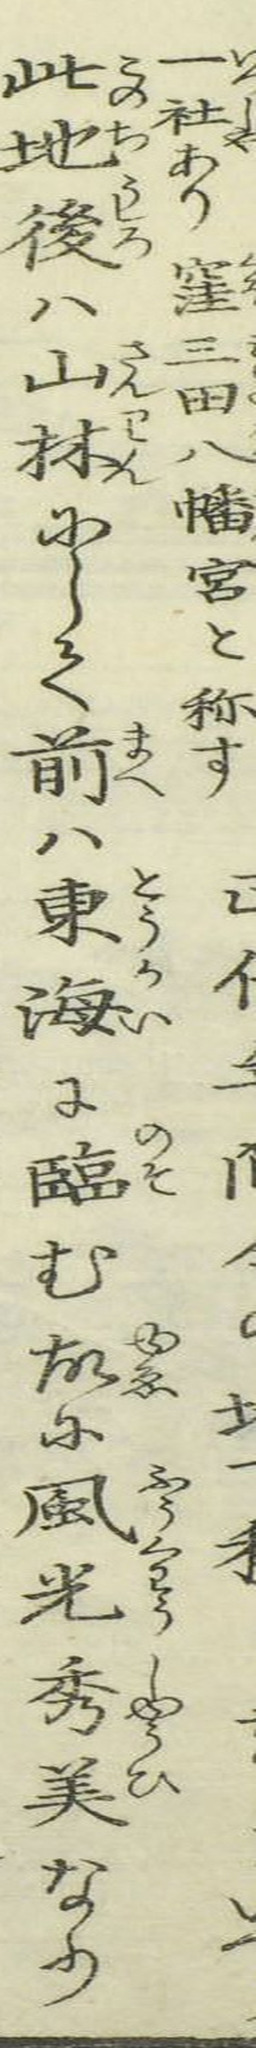此地後は山林にして前は東海に臨む故に風光秀美なり
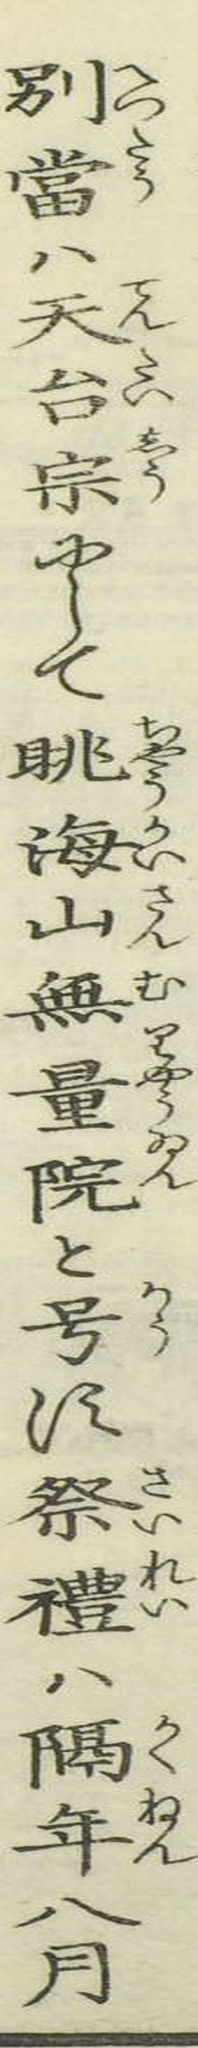別當は天台宗にして眺海山無量院と号す祭禮は隔年八月
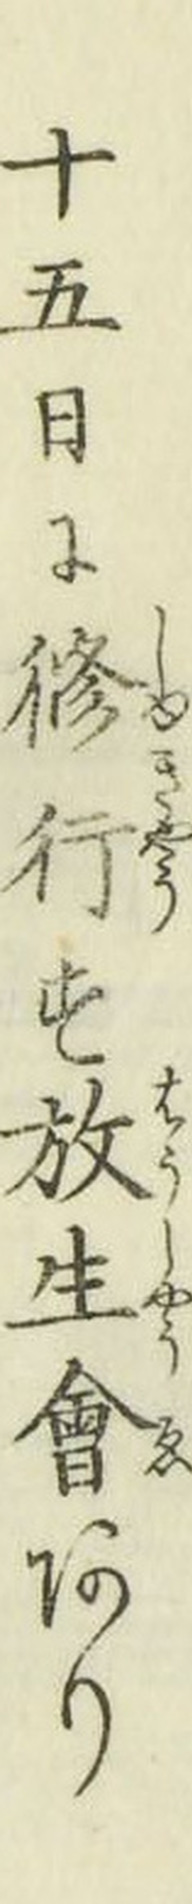十五日に修行す放生會あり
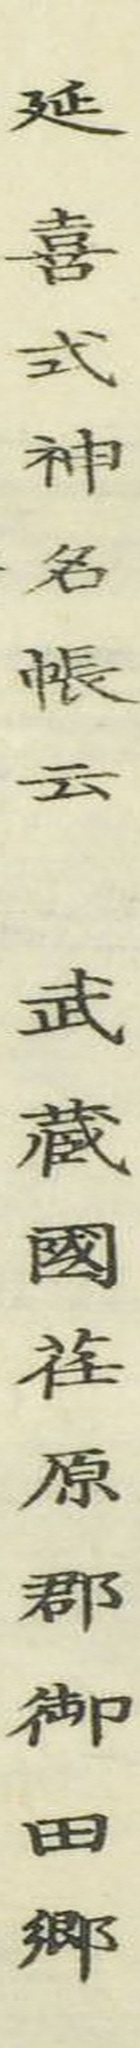延喜式神名帳云武蔵國荏原郡御田郷
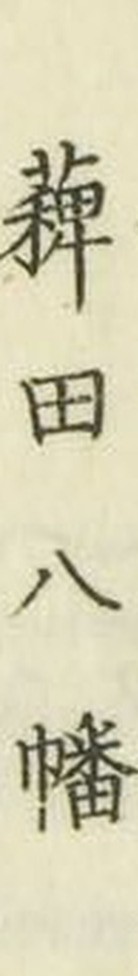薭田八幡
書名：江戸名所図会 20巻 巻之3
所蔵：東京学芸大学教育コンテンツアーカイブ
